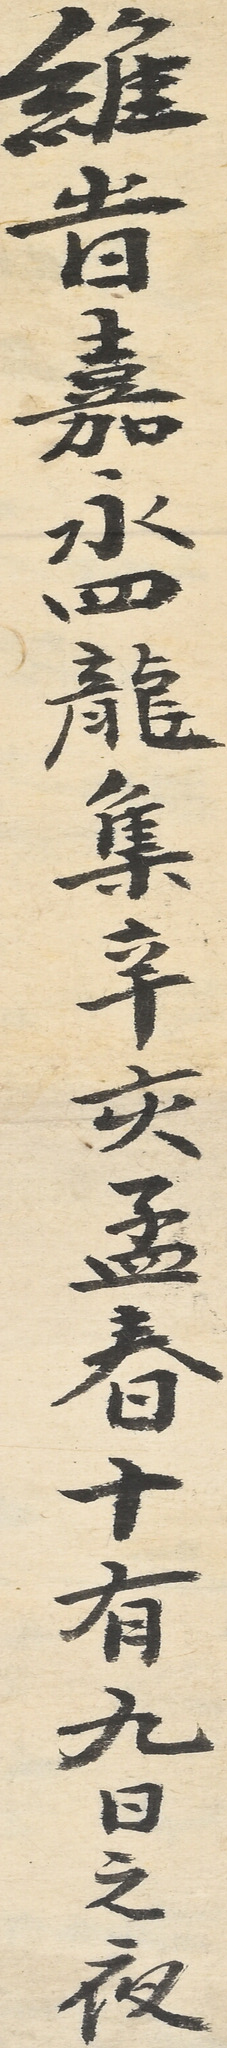維旹嘉永四龍集辛亥孟春十有九日之夜
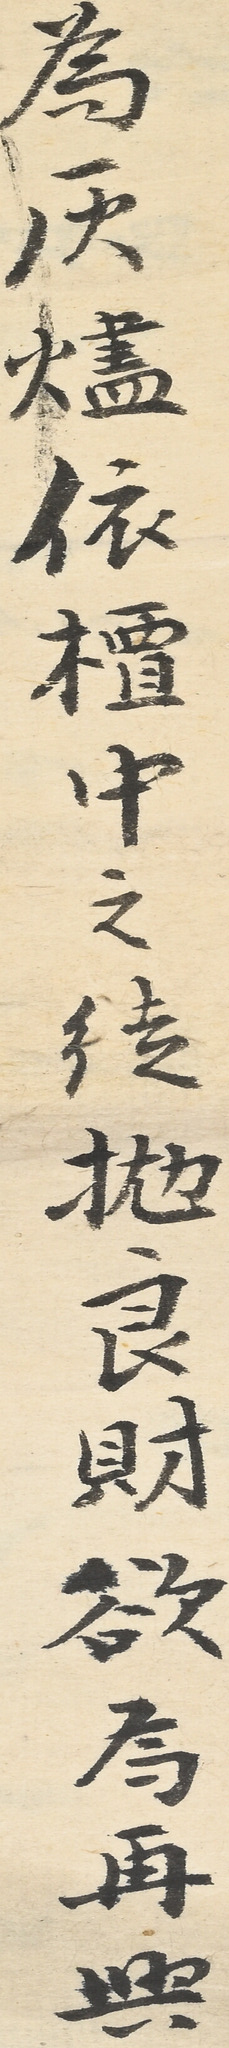為灰燼依檀中之徒抛良財欲為再興
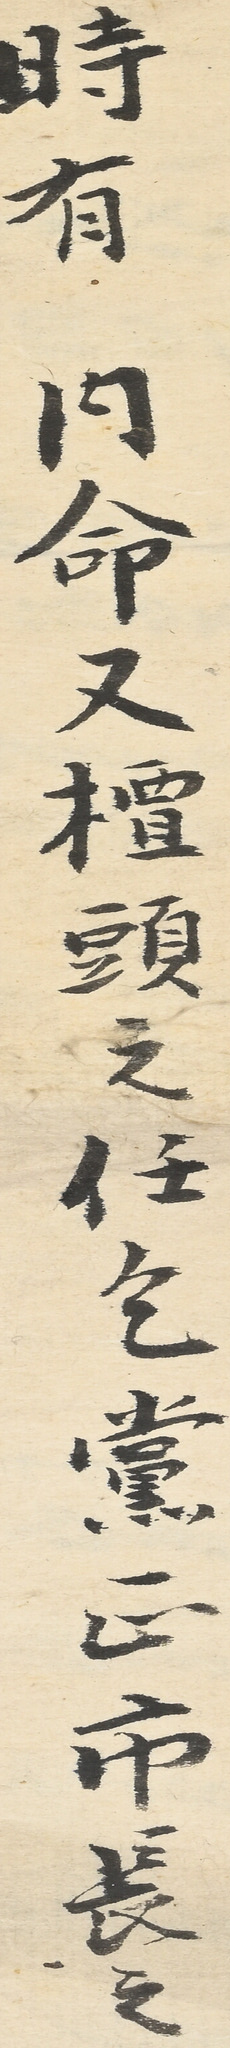時有内命又檀頭之任乞党正市長之
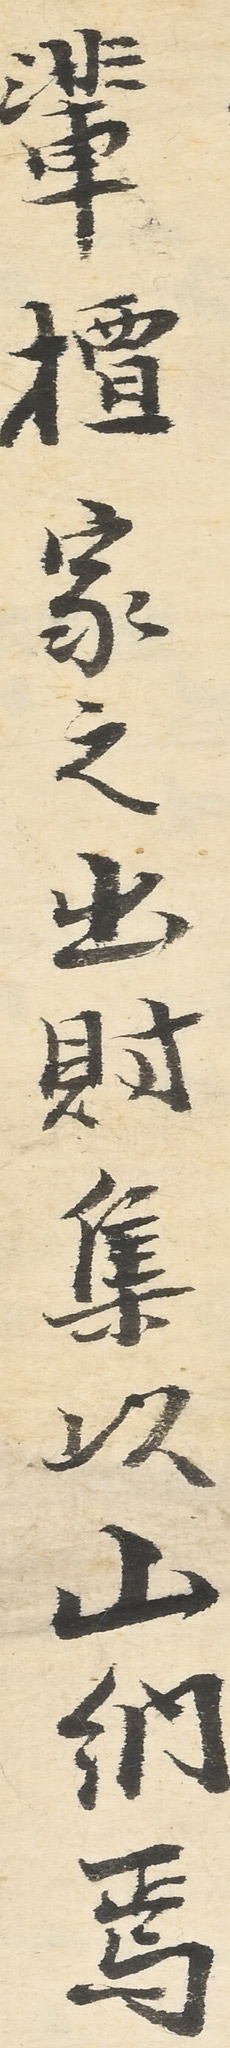輩檀家之出財集以山納焉
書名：建福寺再建寄付金名前書
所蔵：伊那市立高遠町図書館・合同会社AMANE
